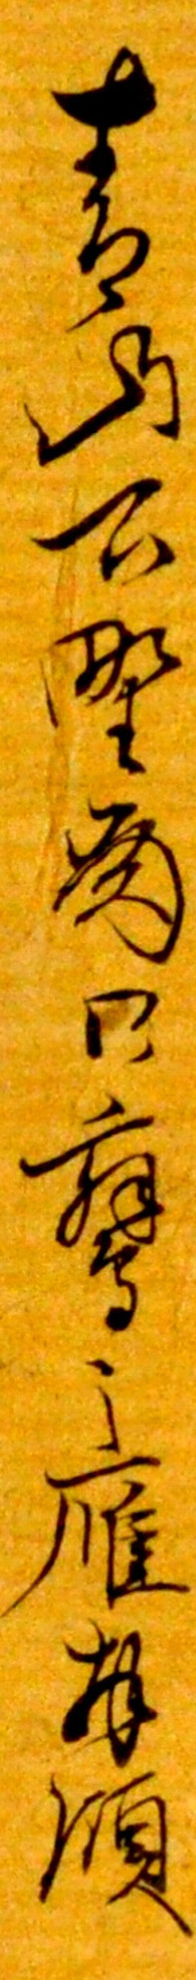青山下野殿御鷹之雁拝領

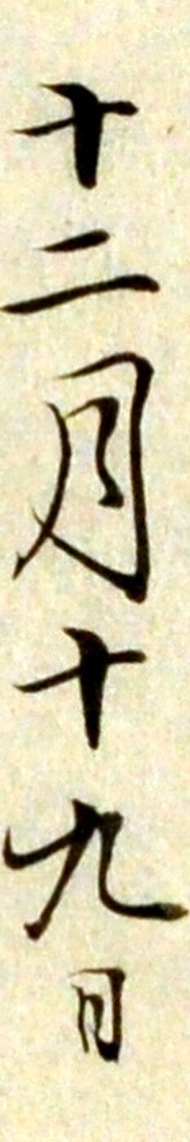十二月十九日
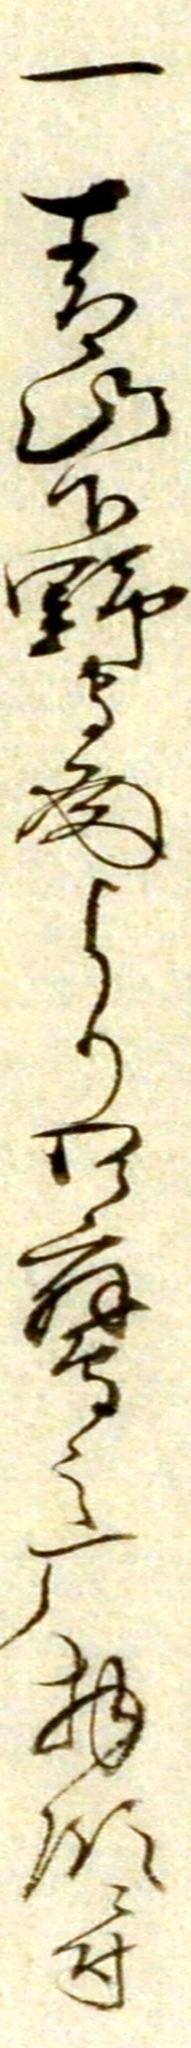一青山下野守殿より御鷹之雁拝領ニ付
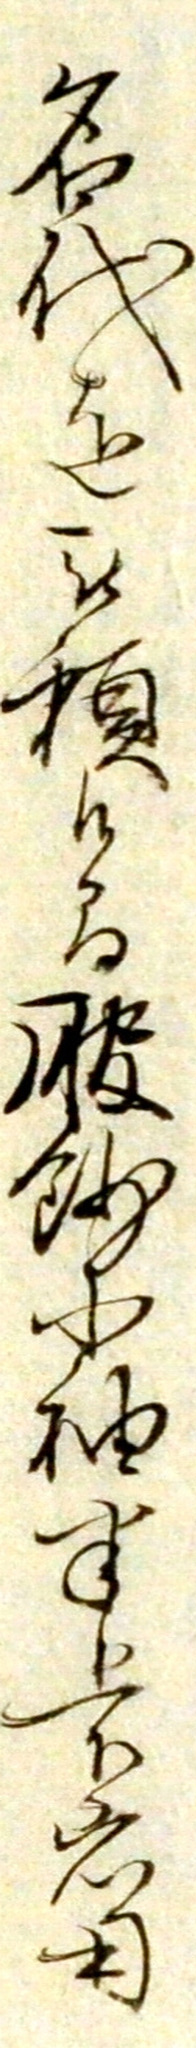名代を被頼候間服紗小袖半上下着用
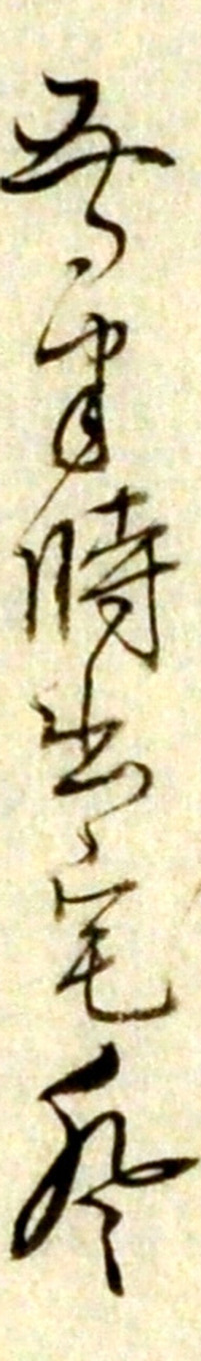五ツ半時出宅登城
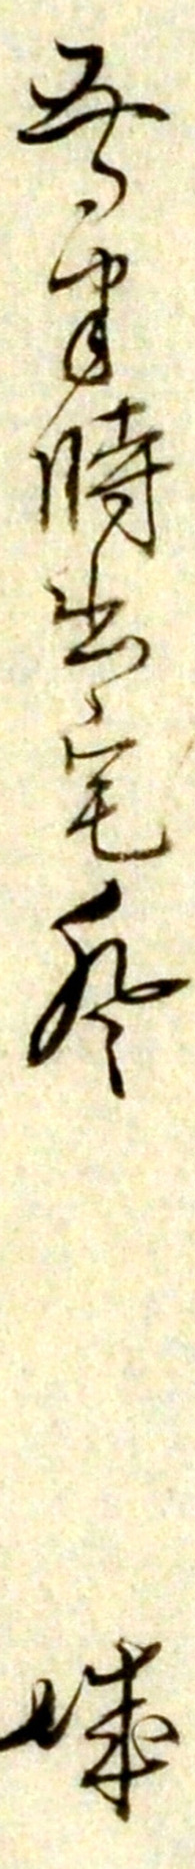五ツ半時出宅登城
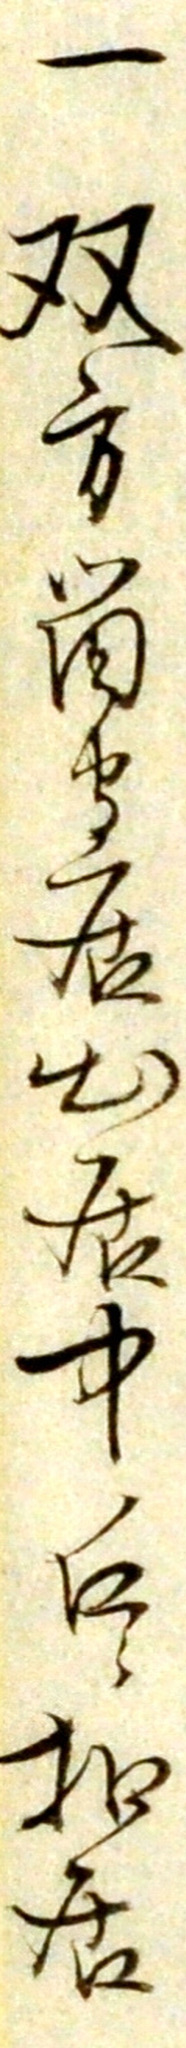一双方留守居出居中ノ口ニ扣居
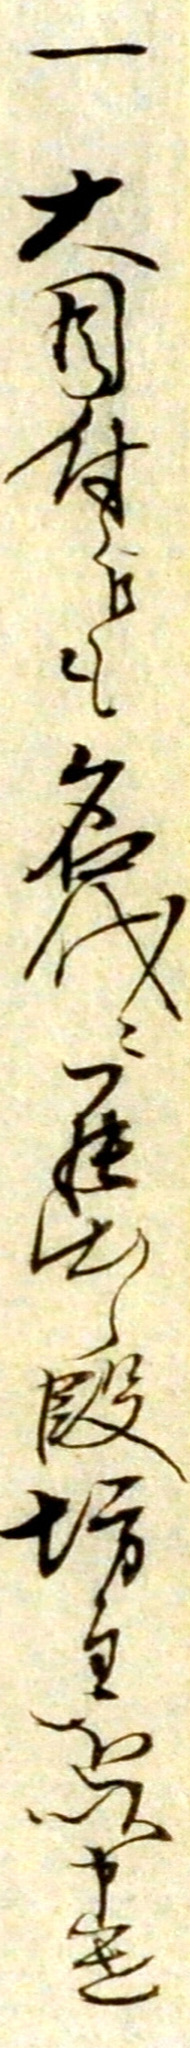一大目付えも名代ニ罷出候段坊主を以申遣
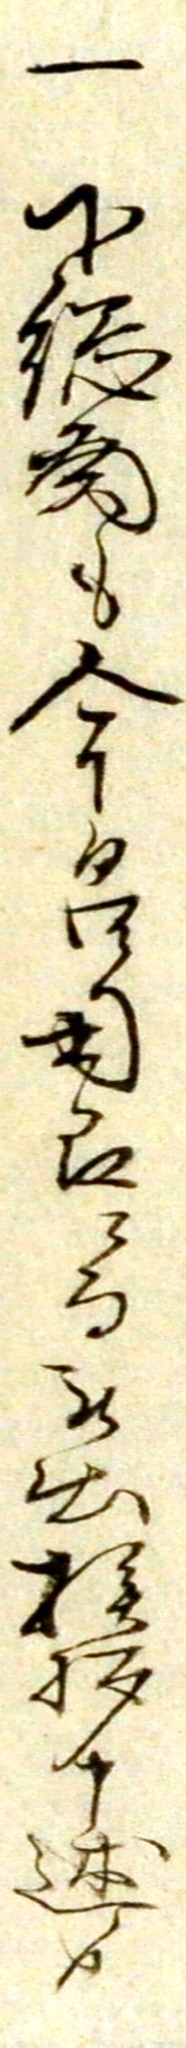一下総殿も今日御用召ニ而被出挨拶申述候
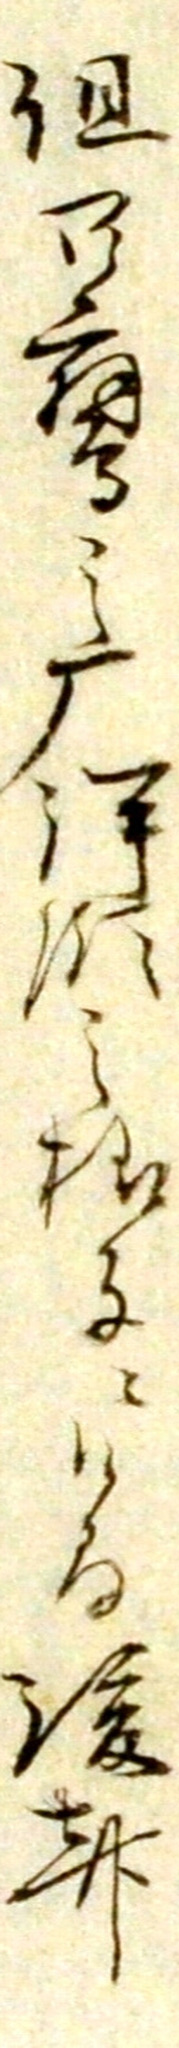但御鷹之雁拝領之様子ニ候間後刻
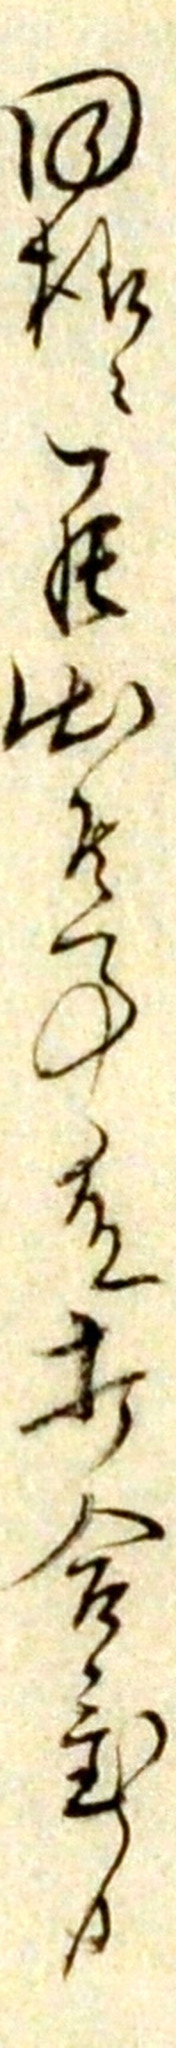同様ニ罷出候事故打合置候
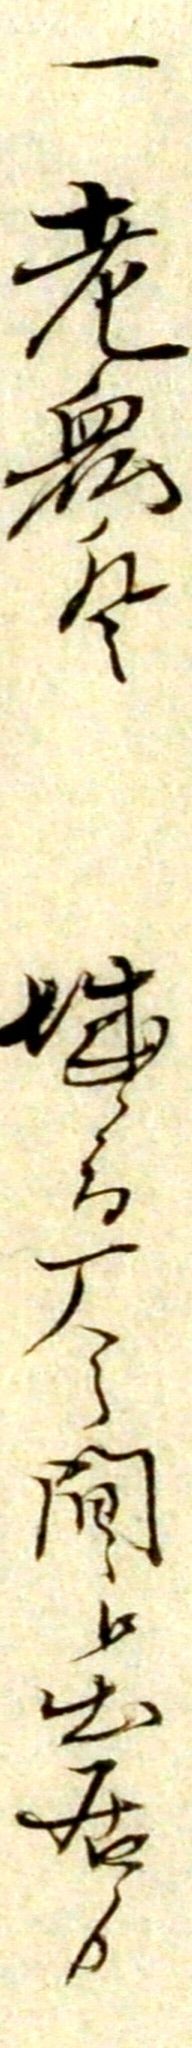一老衆登城ニ而雁之間え出居候
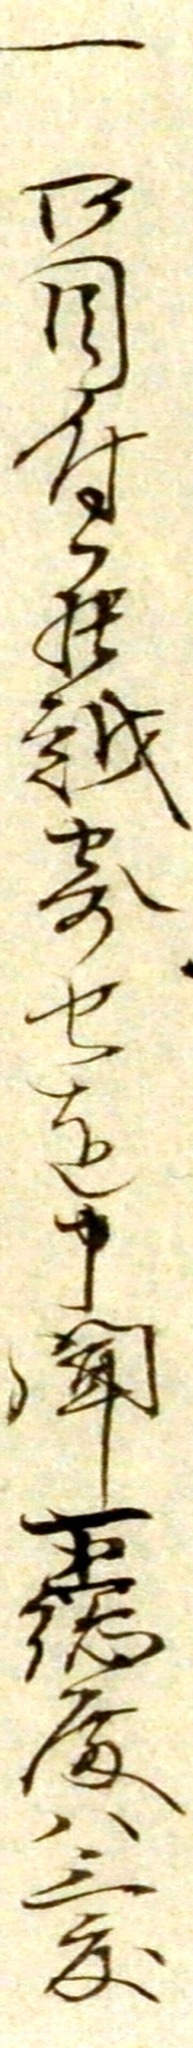一御目付罷越寄セを申聞下総殿ハ三度

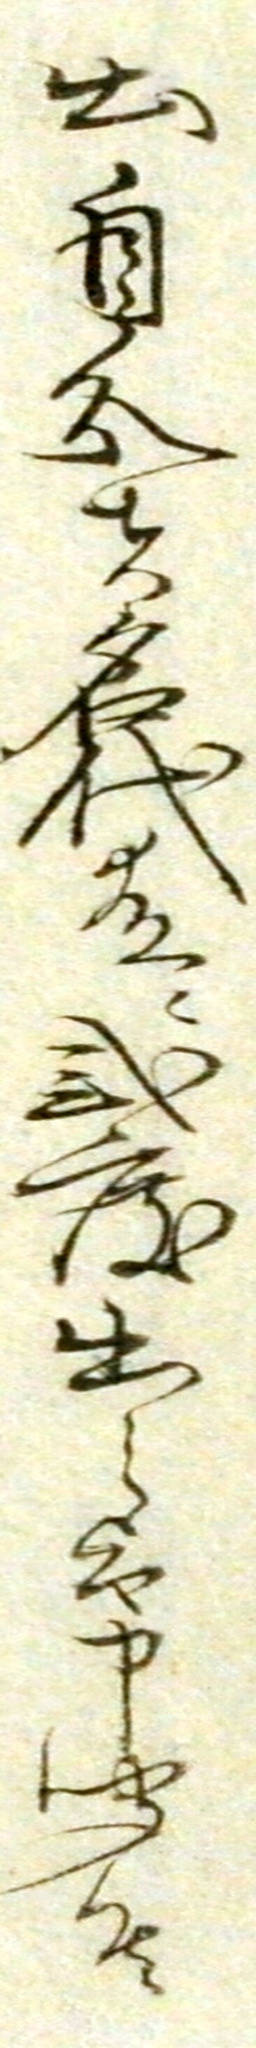出自分は名代故ニ弐度出之旨申聞候
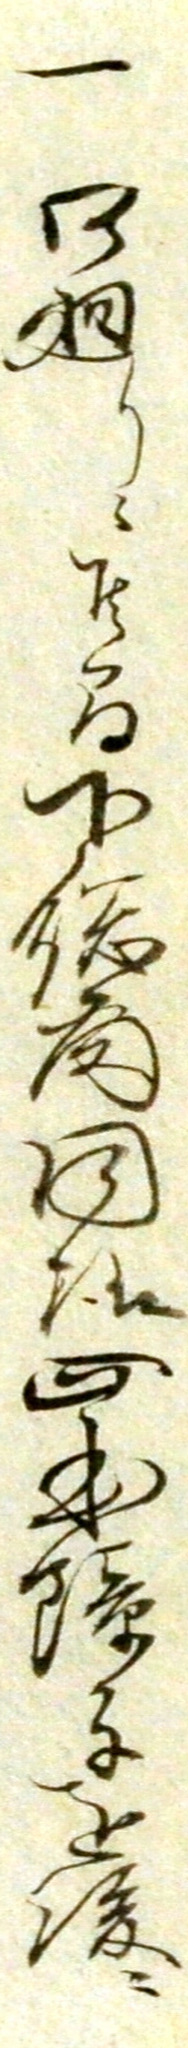一御廻りニ候間下総殿同様四本障子を後ニ
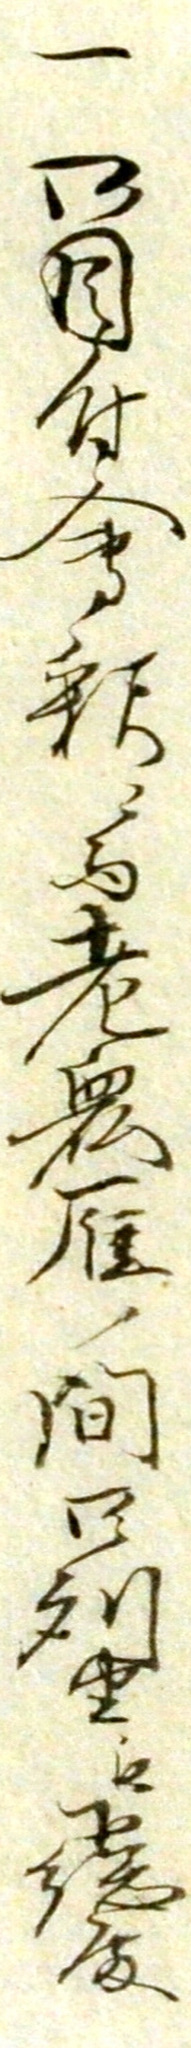一御目付会釈ニ而老衆雁ノ間御列坐え下野殿
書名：諸名代相勤候節ノ留書外
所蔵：伊那市立高遠町図書館・合同会社AMANE
